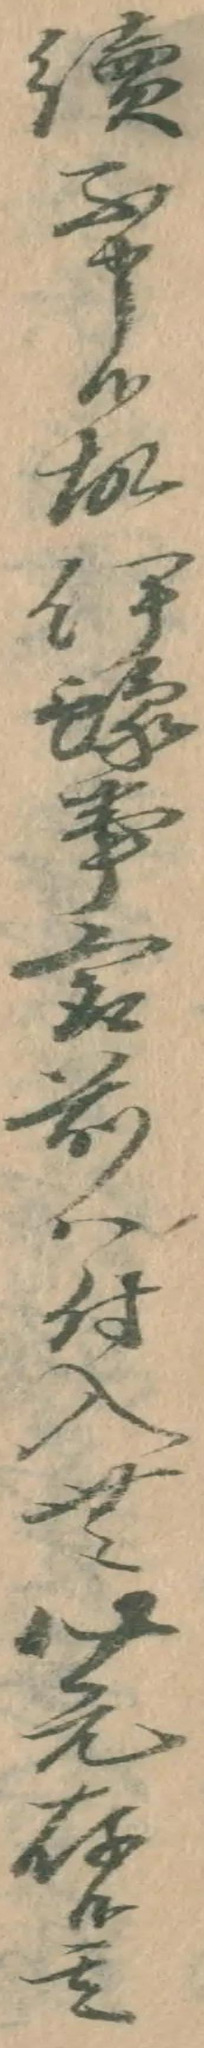続不申候故伊予事最前は付入無心元在候其
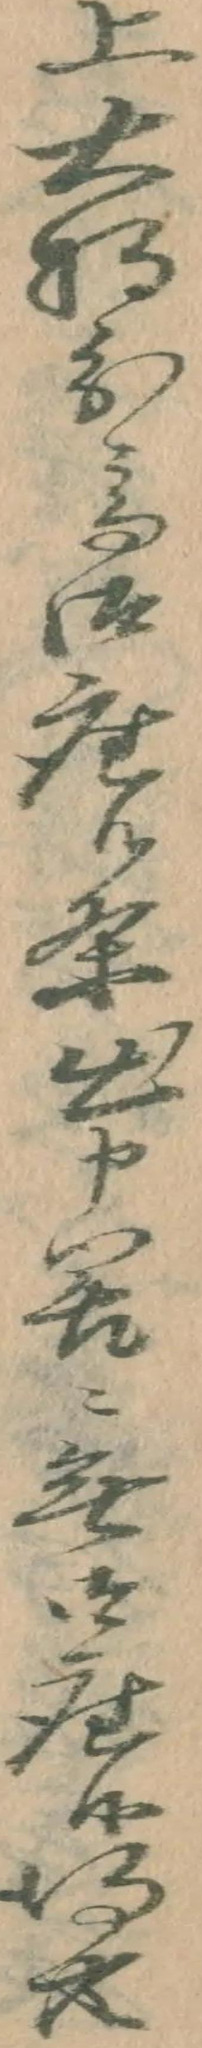上大将分に而御座候条出申開に無御座候得共

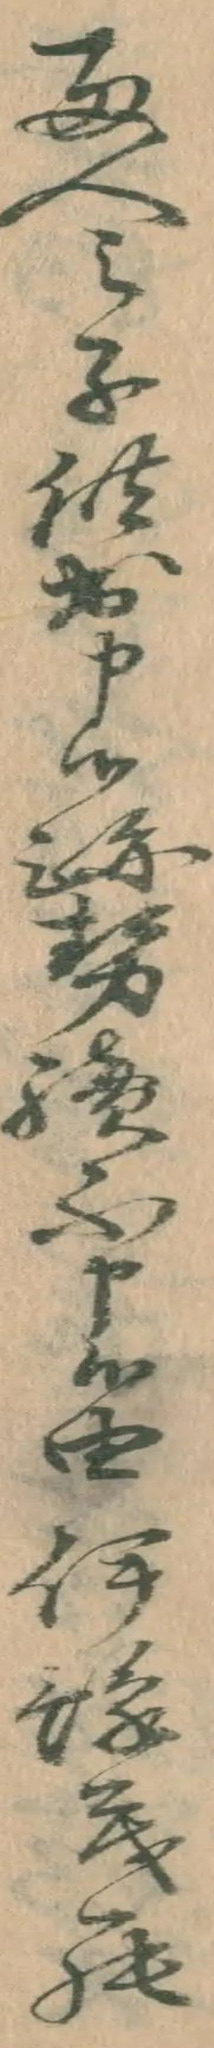両人之子供出申候跡勢続不申候由伊予も罷
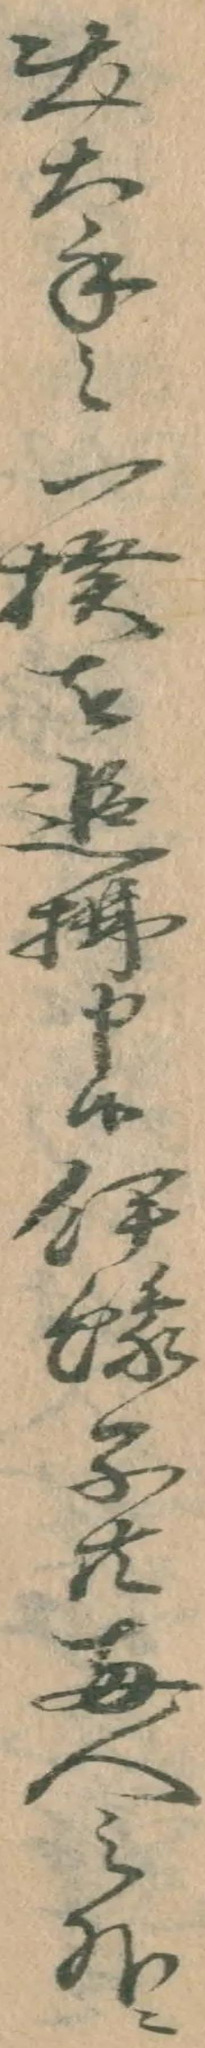出大手之一揆を追払申候伊予子共両人之外に
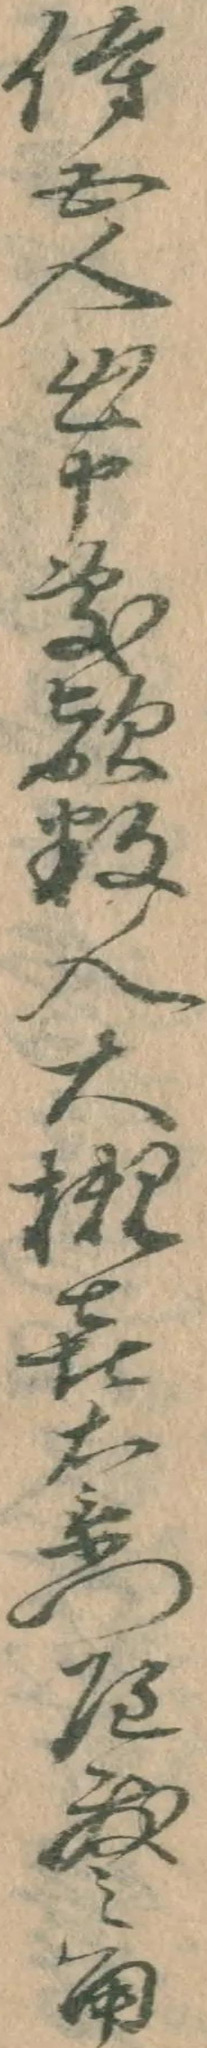侍五人出申処敵数人大槻喜右衛門屋敷之角
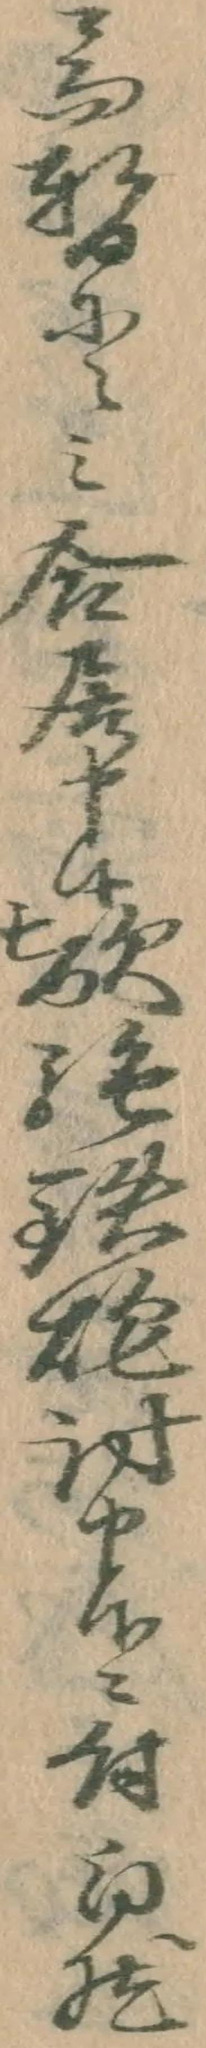に而暫にらみ合居申候敵絶鉄炮討申候に付自然
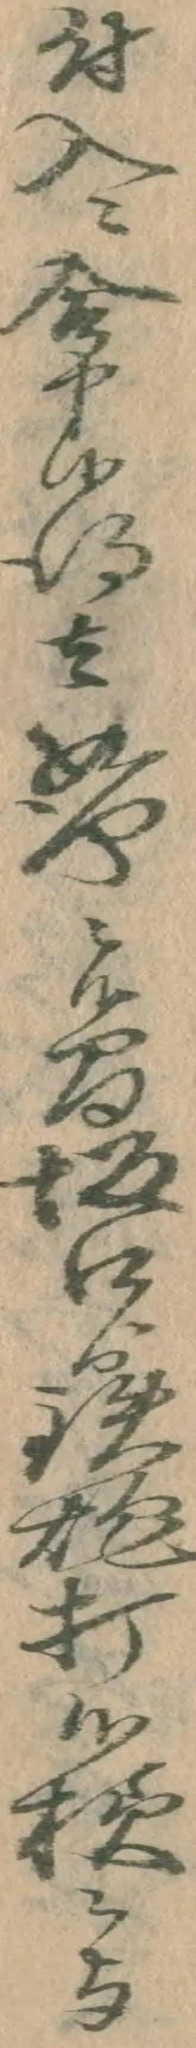付入に合申候得は如何に候間坂口ゟ鉄炮打候様にと
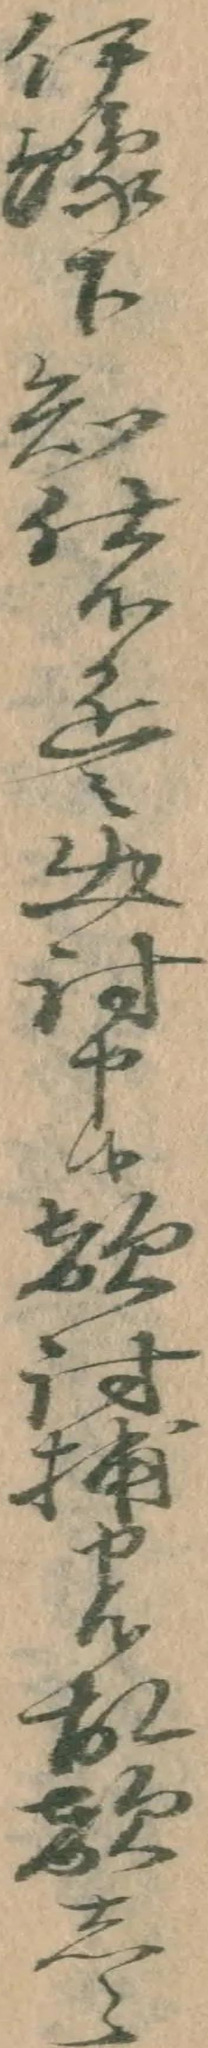伊予下知仕候進み出討申候敵討捕申候故敵しら
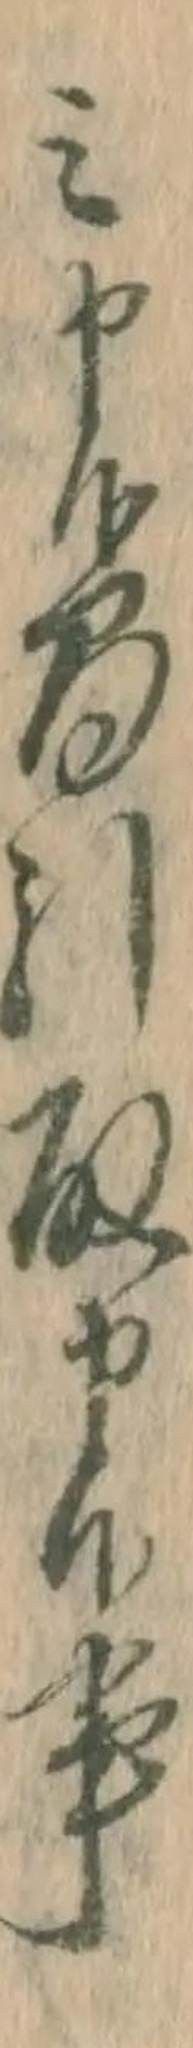み申候間引取申候事
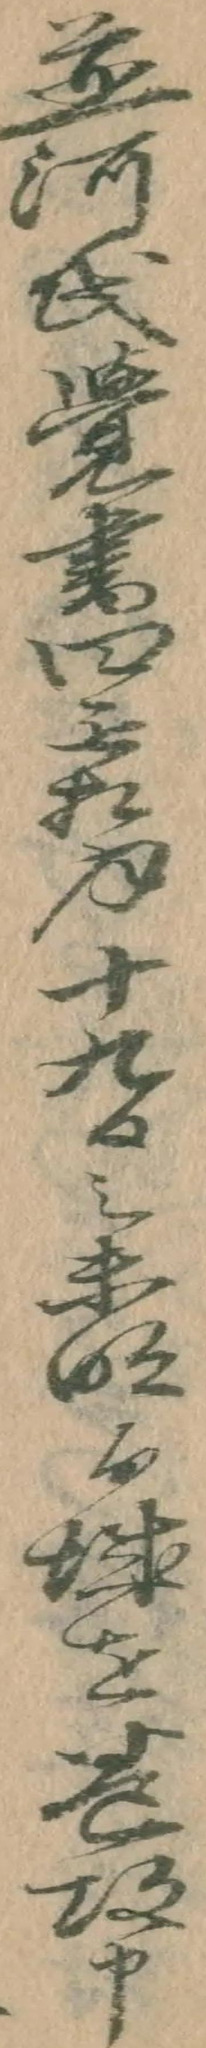並河氏覚書曰霜月十九日之未明ゟ城を巻攻申
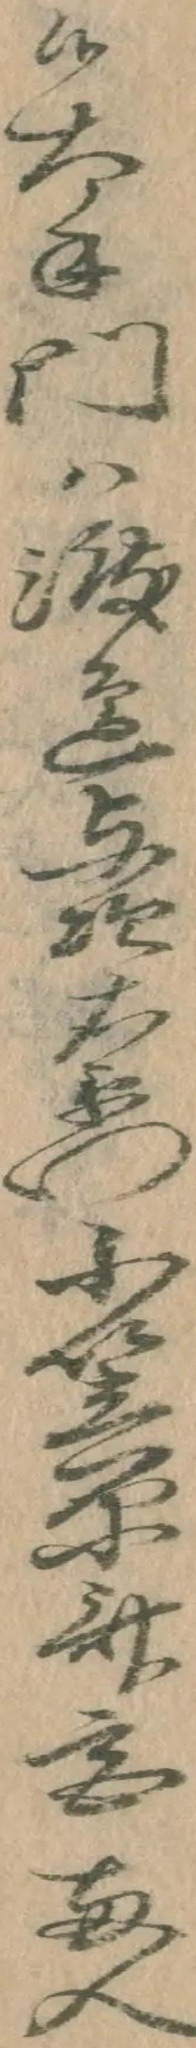候大手門は渡辺与次右衛門小笠原斎宮両人
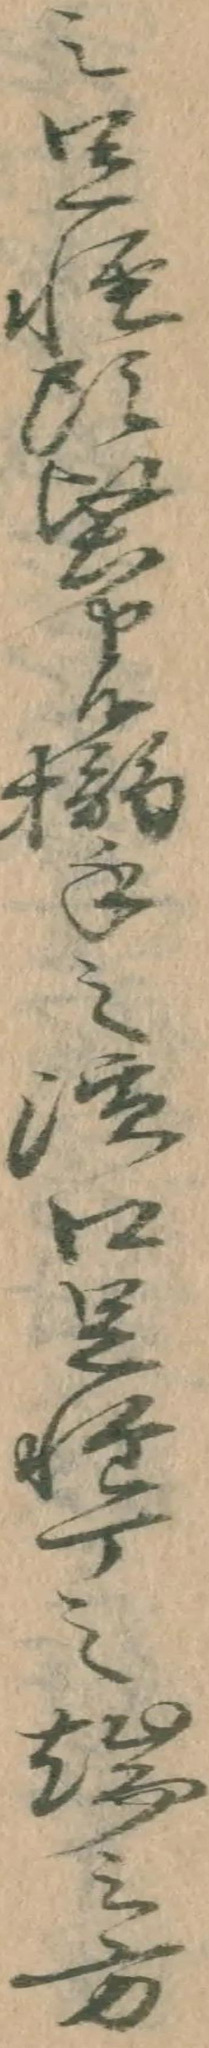之足軽頭堅申候搦手之浜口足軽丁之端之方
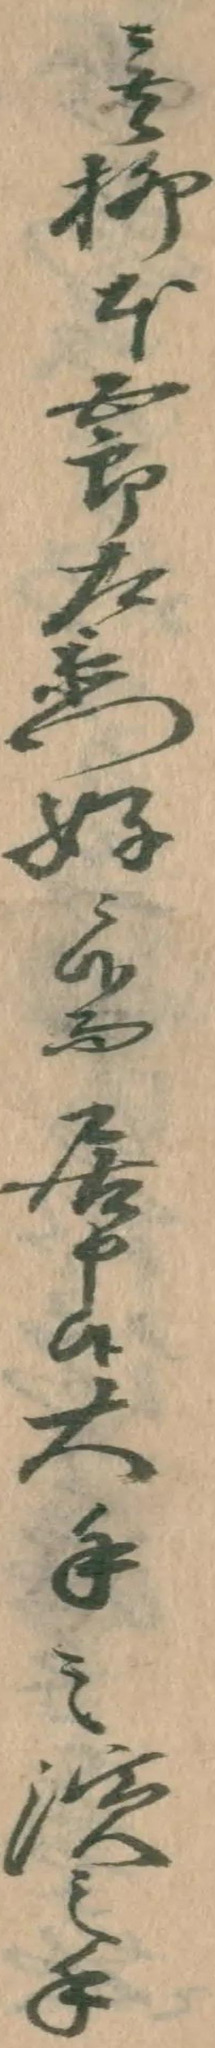には柳本五郎左衛門好に候而居申候大手之浜之手
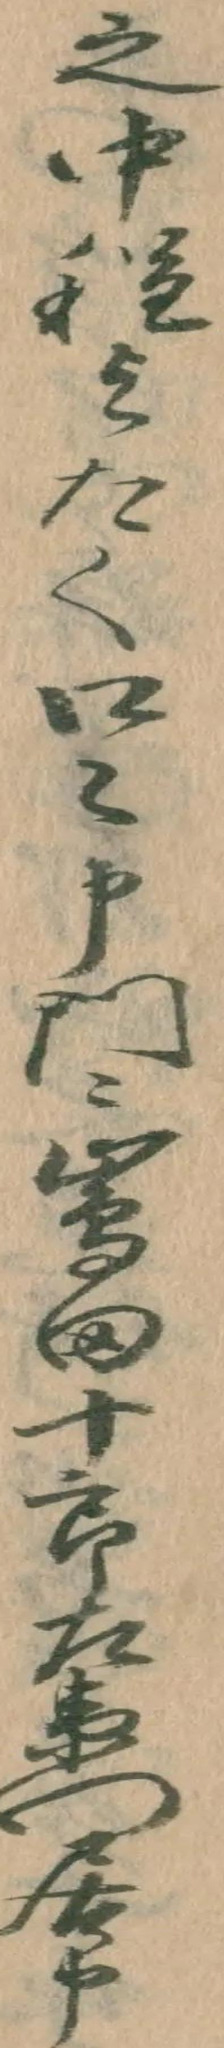之中程とおく口之申門に富田十郎左衛門居申
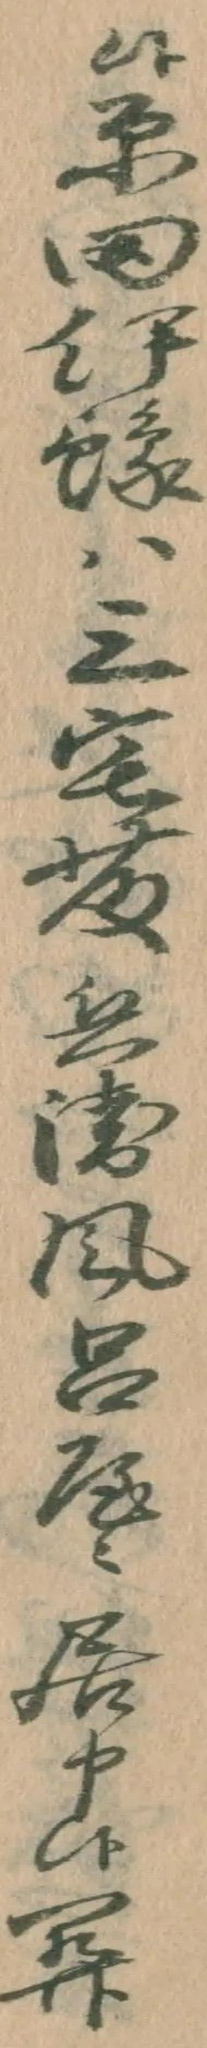候原田伊予は三宅藤兵衛風呂屋に居申候関
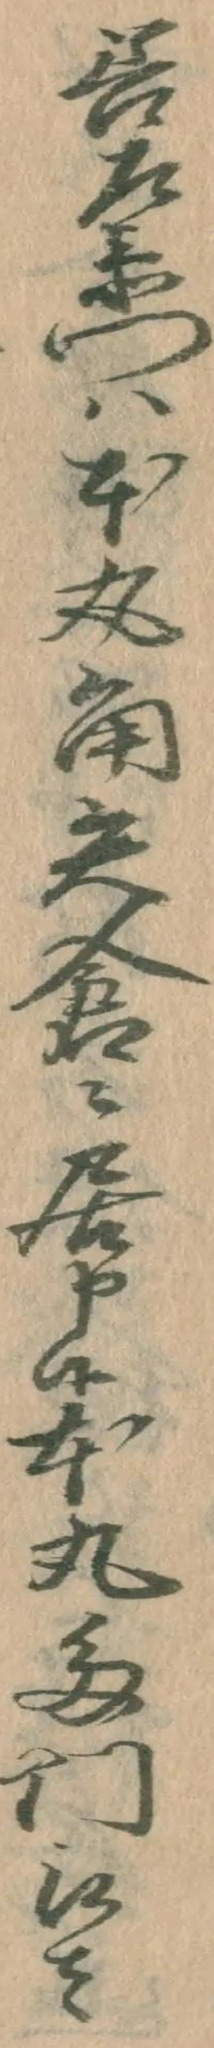善左衛門は本丸角矢倉に居申候本丸多門江は
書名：切支丹御退治記 49巻. [3]
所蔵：国立国会図書館 National Diet Library, JAPAN
